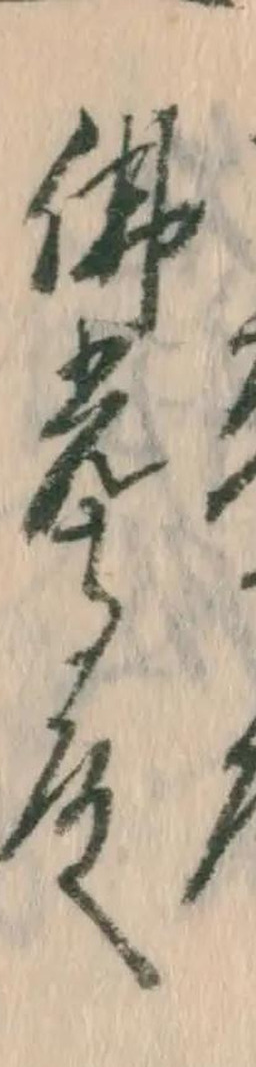仏光寺殿
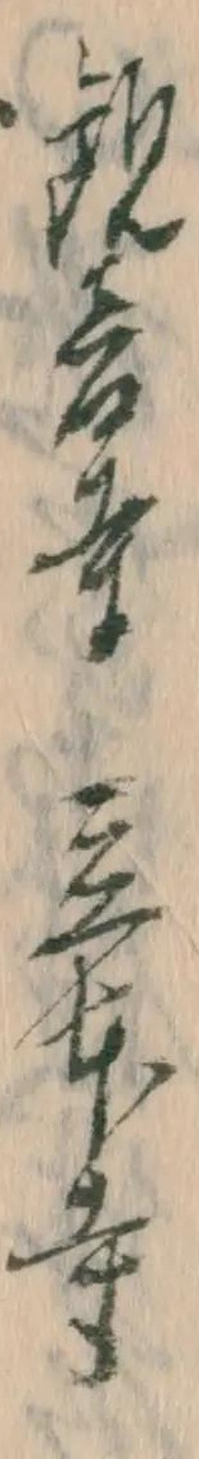観音寺立本寺
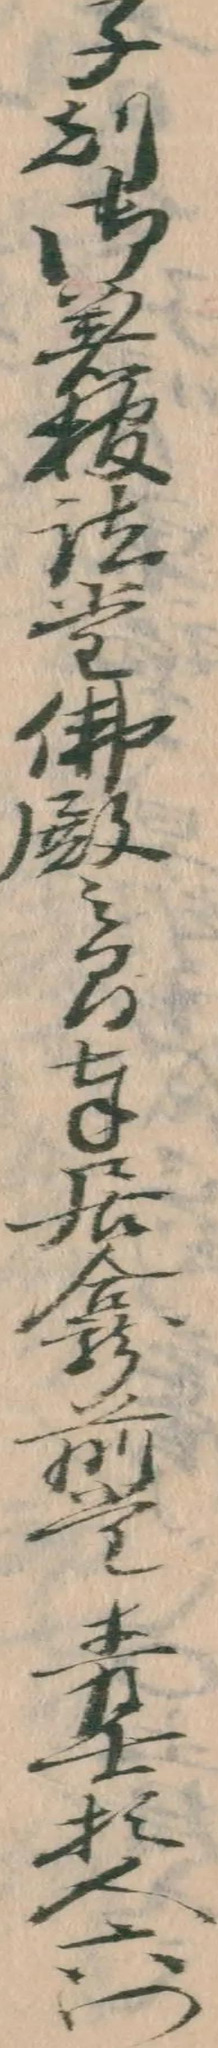子刻御着披法堂仏殿之間奉居合蔵前堂青士拾人六門
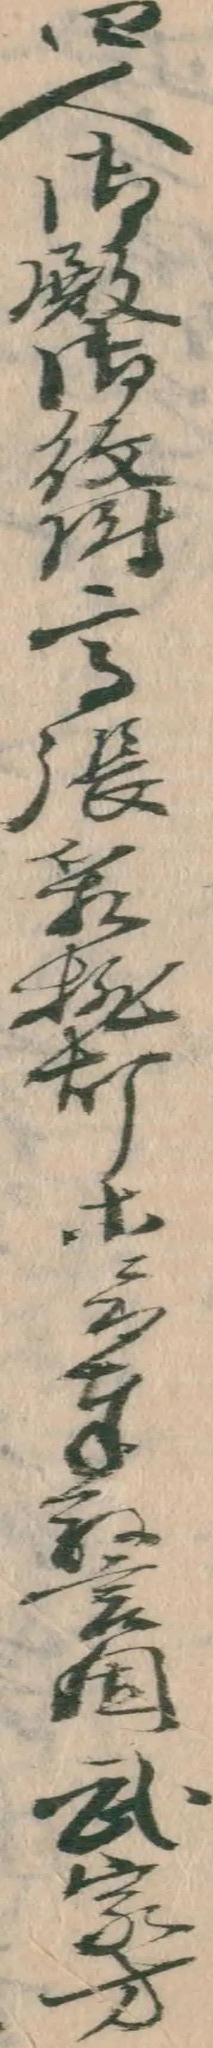四人御殿御紋附高張箱挑灯等ニ而奉致言因武家方
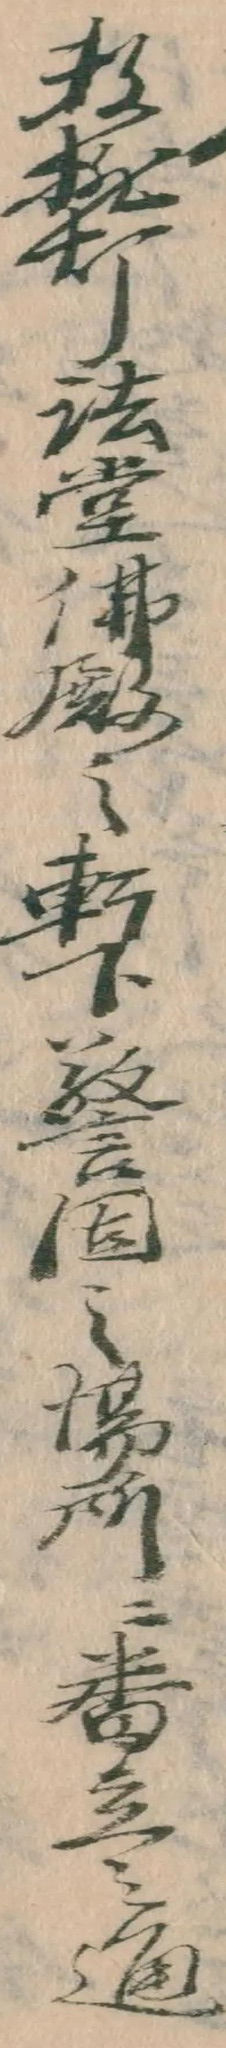数挑灯法堂仏殿之軒下警固之場所ニ番立之通
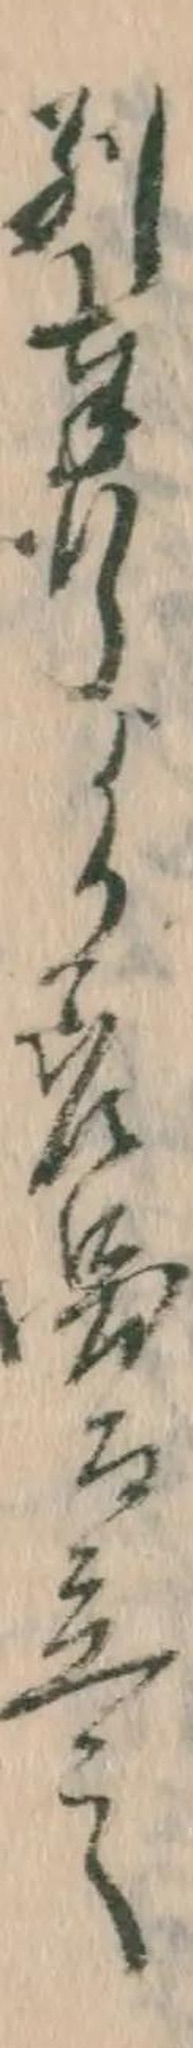列奉行より差図而立之
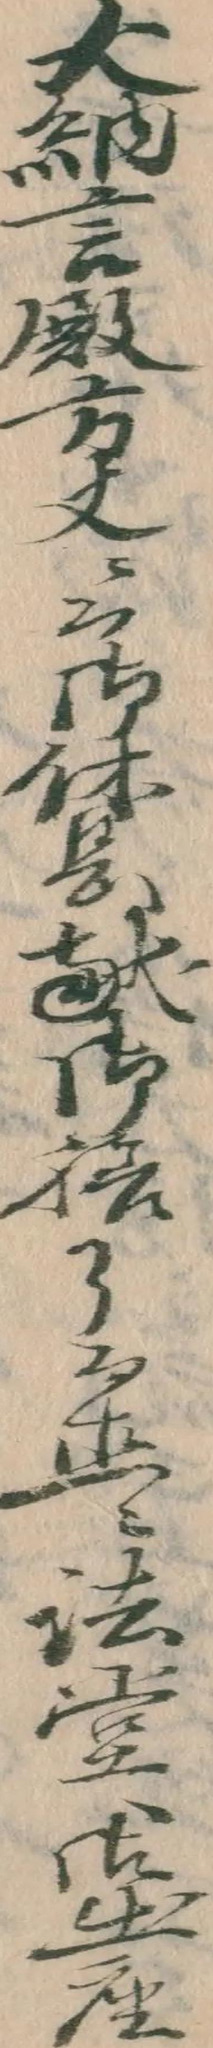大納言殿方丈ニ而御休息献御籍了而直ニ法堂へ御出座
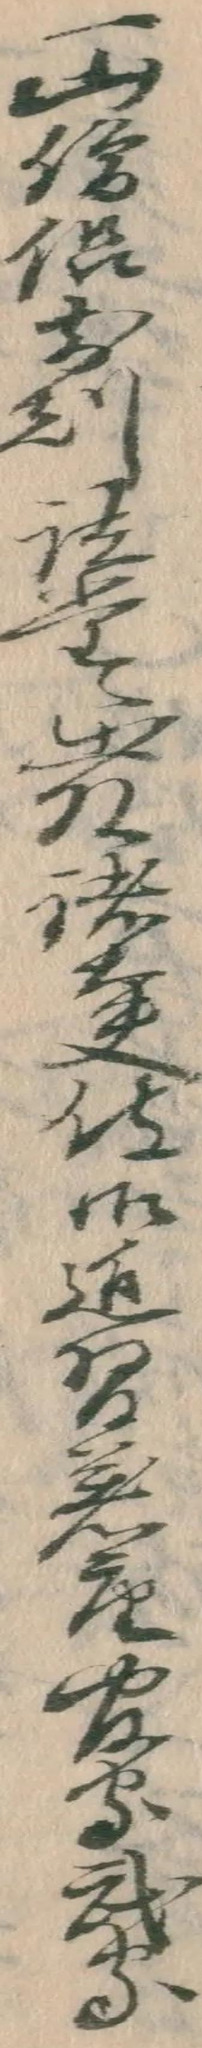一山僧前列諸堂へ出頭諸大夫侍御近習着座官家武家
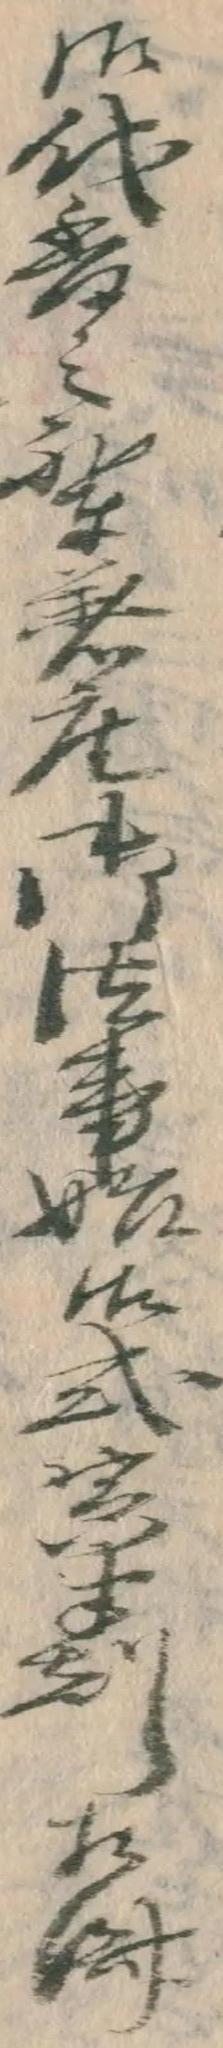御代香之輩着座御法事始御式寅半刻相済
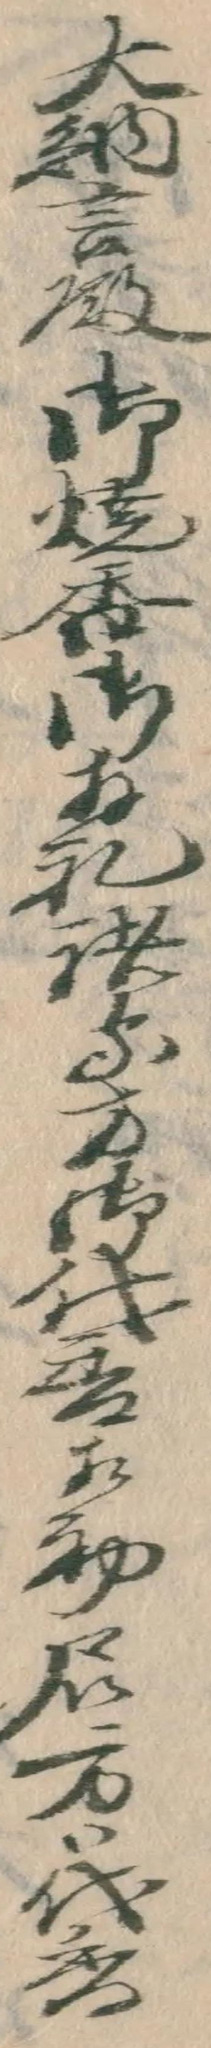大納言殿御焼香御拝礼諸家方御代替相勤君方御代香
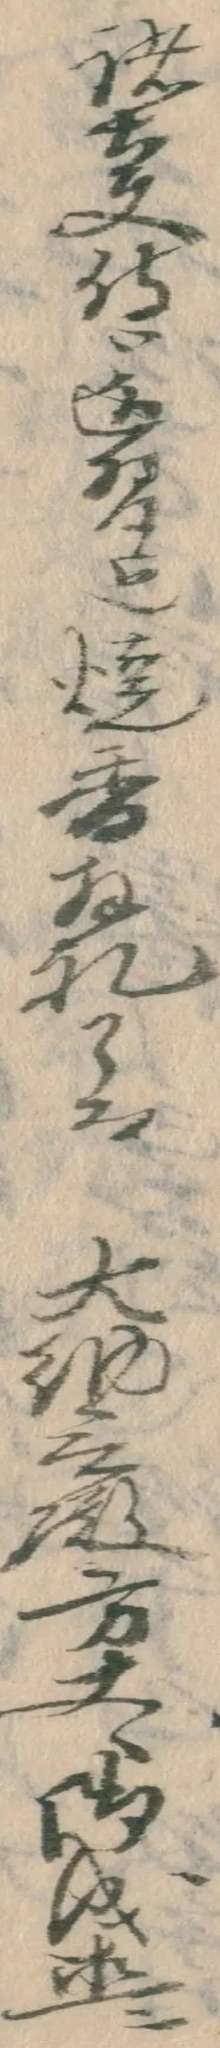諸大夫侍御近習迄焼香拝礼了而大納言殿方丈へ御成直ニ
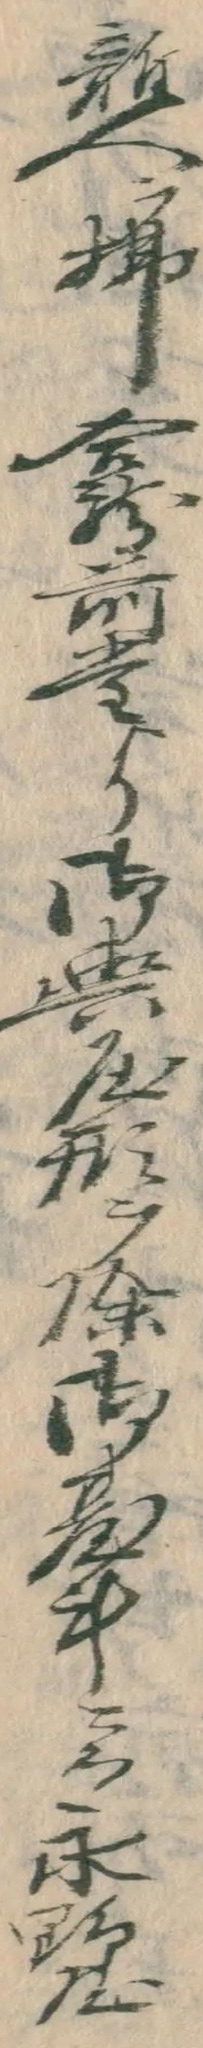雑人ヲ払入籠前堂より御輿屋形ヲ除御䑓斗ニ而永野屋
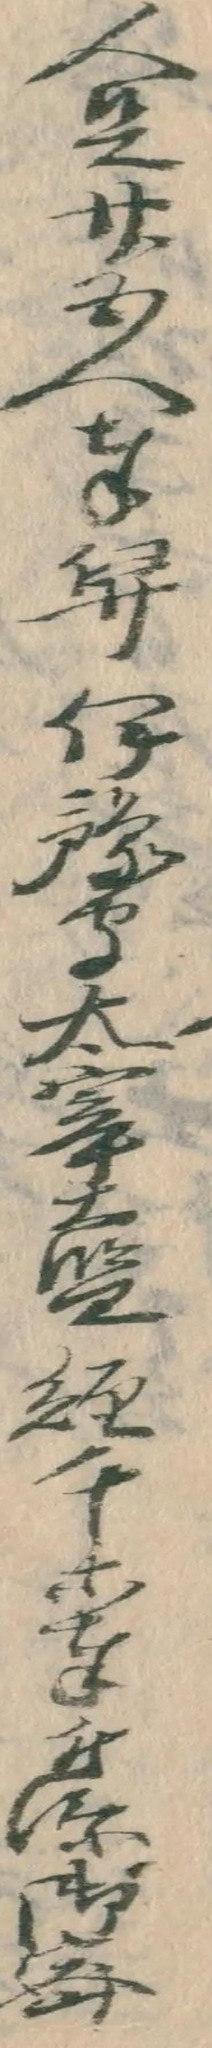人足廿五人奉舁伊豫守太宰大監経千御奉付添御密
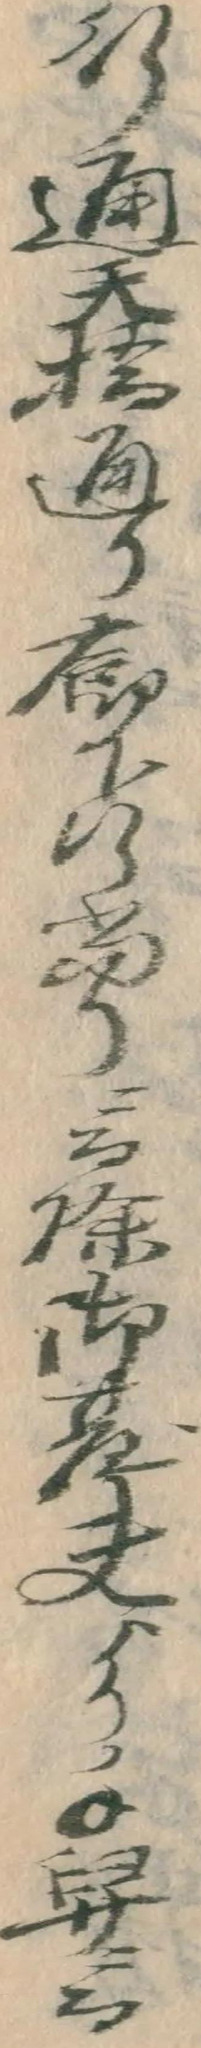行通天橋通り廊下行當り二而除御䑓夫より手舁二而

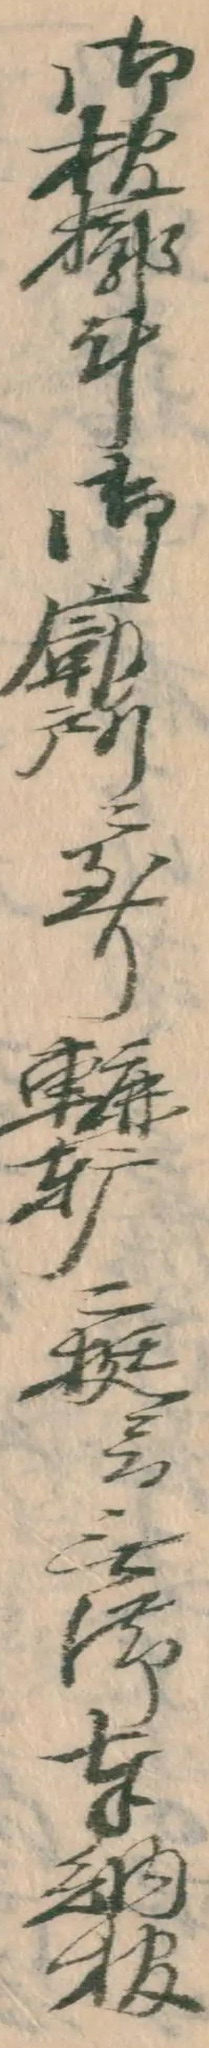御棺槨斗御廟所ニ至リ二挺ニ而無滞奉納棺
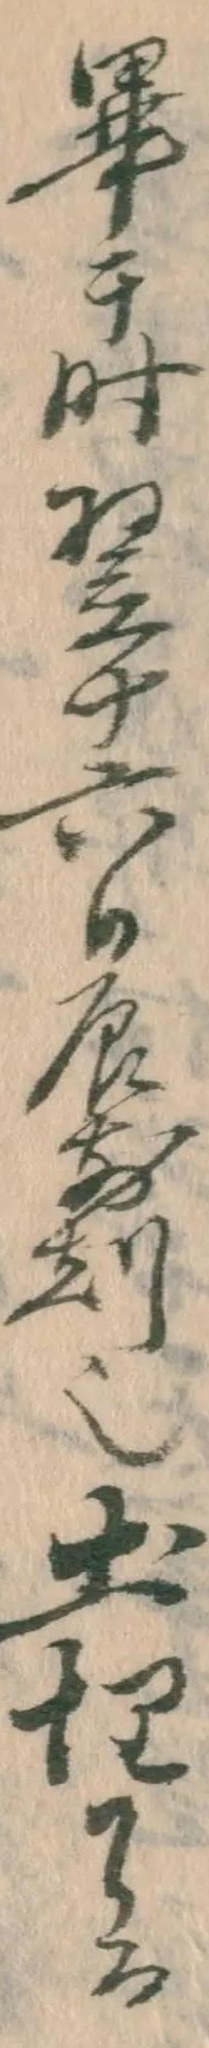畢于時翌十六日辰前刻也出埋葬了而
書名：賀茂社記録. 第67冊
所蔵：国立国会図書館 National Diet Library, JAPAN
